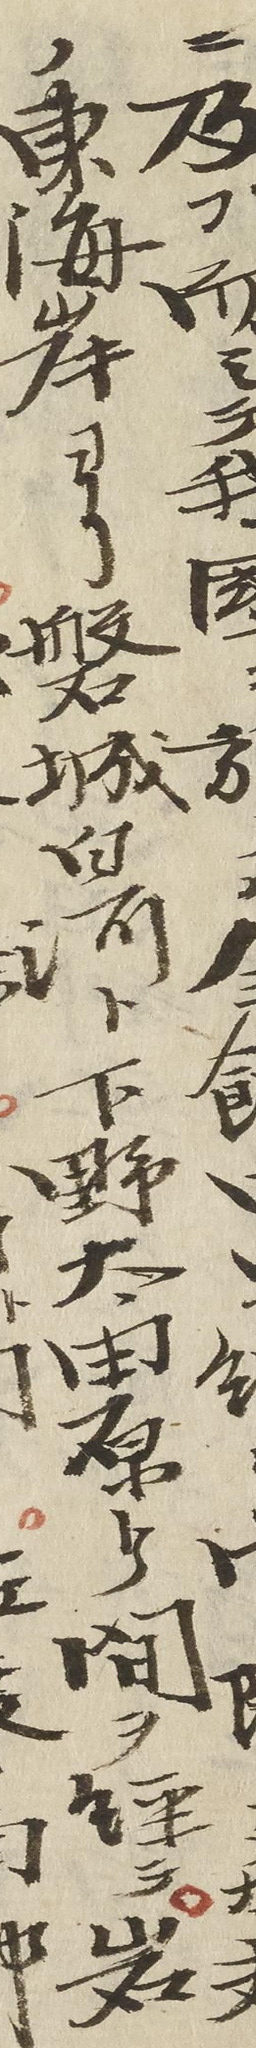ノ東海岸ヨリ磐城白河ト下野太田原トノ間ヲ経テ。岩
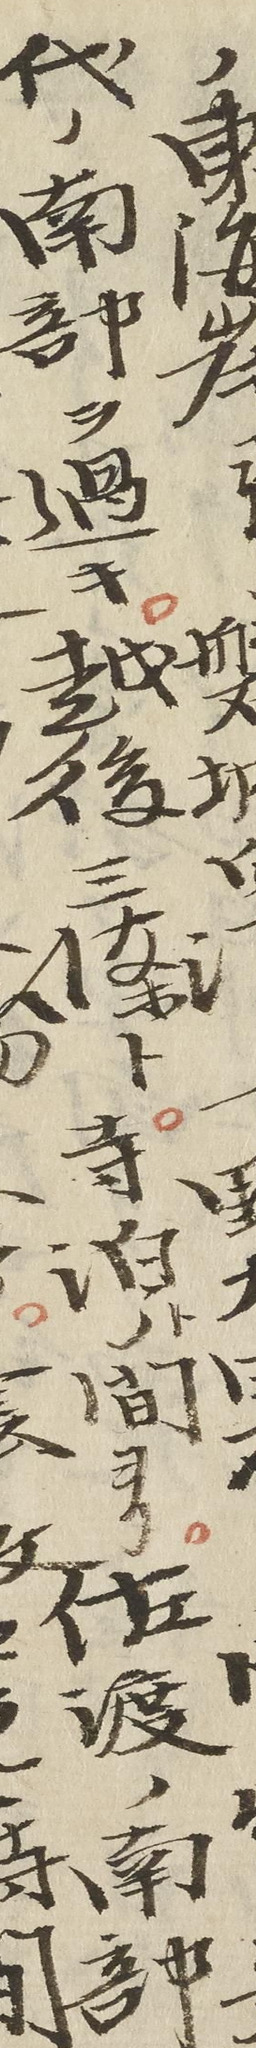代ノ南部ヲ過キ。越後三條ト。寺泊トノ間ヨリ。佐渡ノ南部
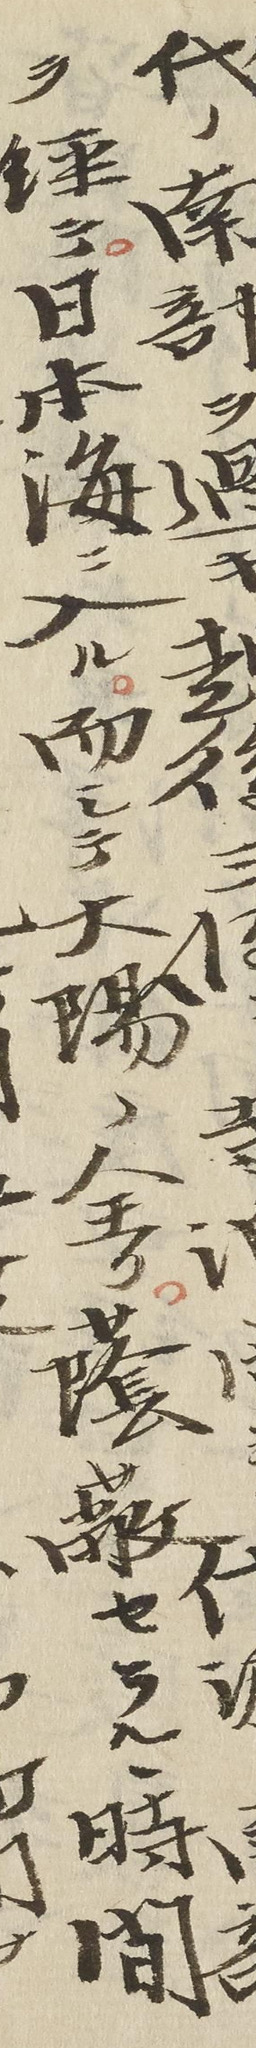ヲ経テ日本海ニ入ル。而シテ大陽ノ全ク。蔭蔽セラルゝ時間
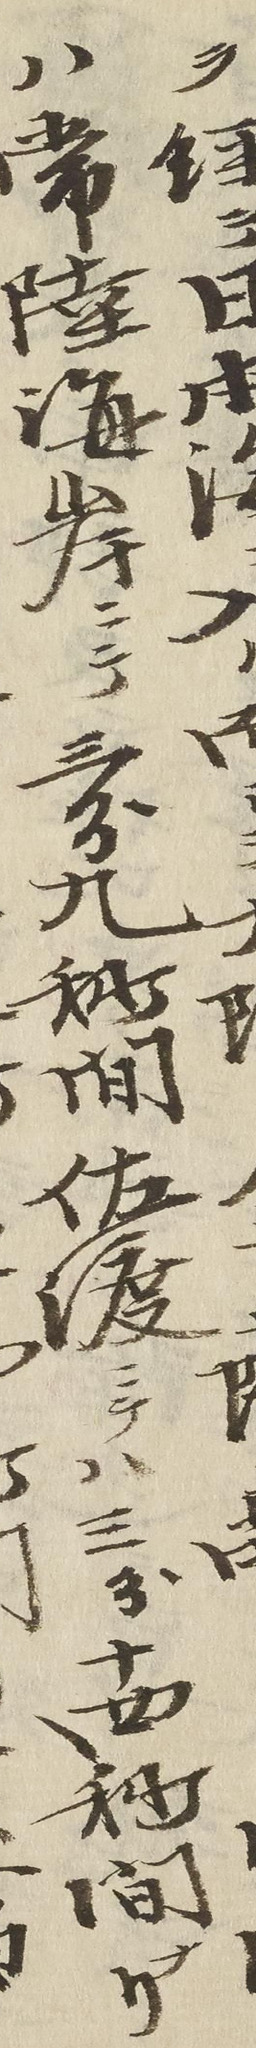ハ常陸海岸ニテ三分九秒間佐渡ニテハ三分十四秒間ナリ
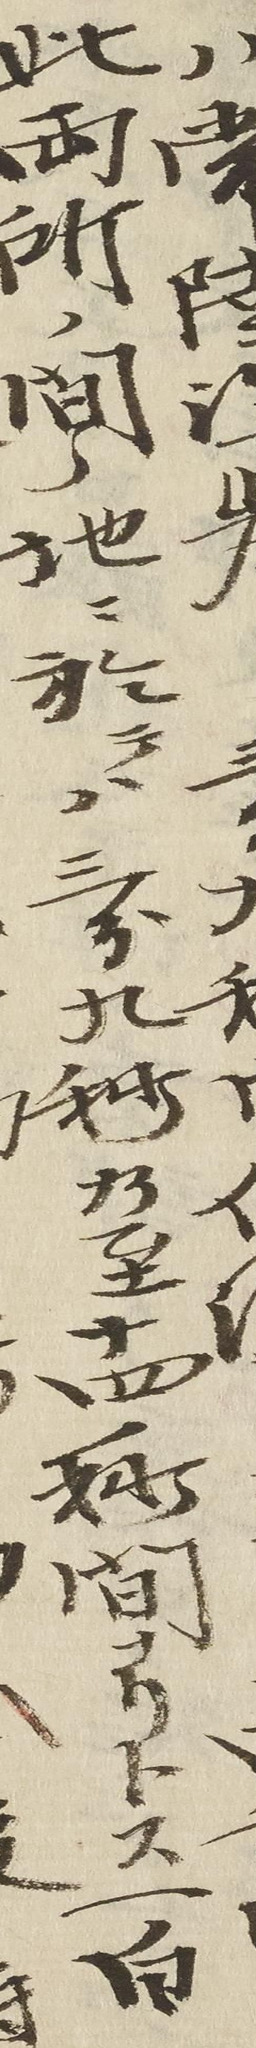此両所ノ間ノ地ニ於テハ三分九秒乃至十四秒間ナリトス（白
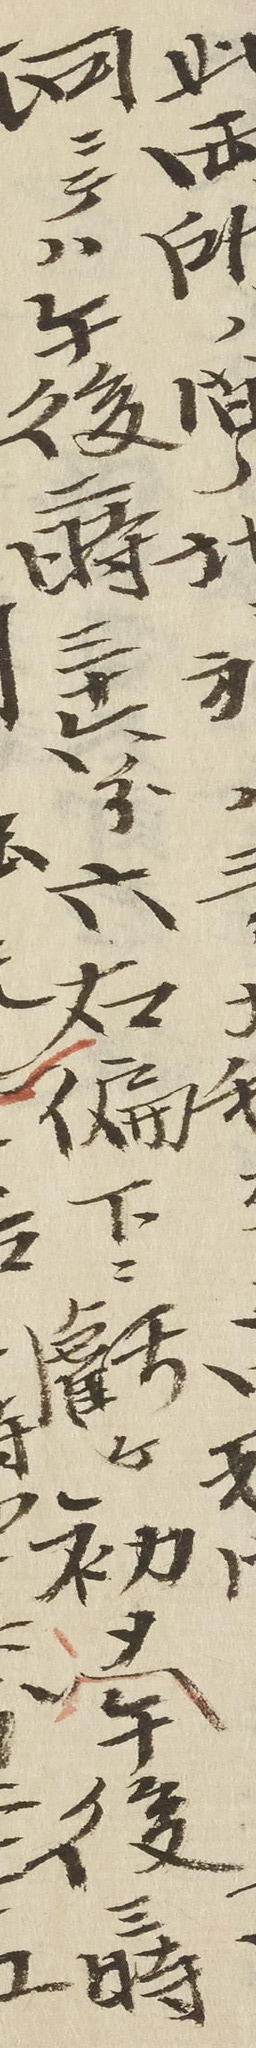河ニテハ午後ニ時三十六分六偏下ニ虧ケ初メ[午後三時
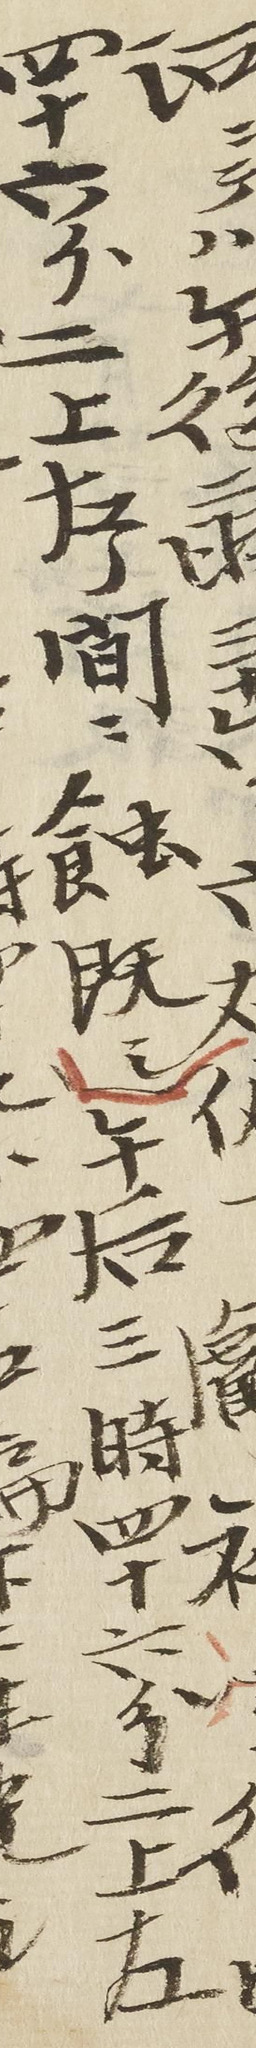四十六分ニ上左ノ間ニ蝕既シ]午后三時四十六分ニ上左
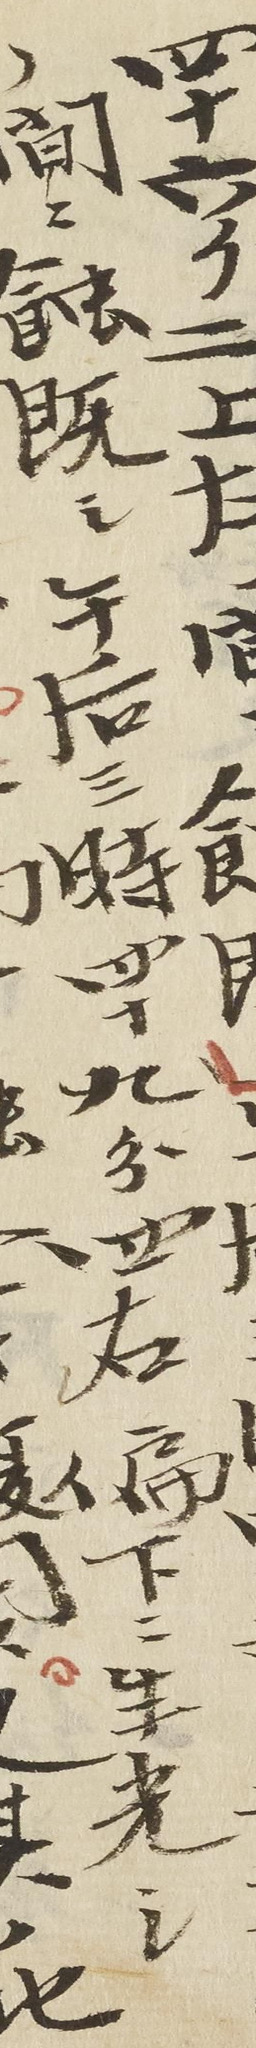ノ間ニ蝕既シ午后三時四十九分四見右偏下ニ生光シ
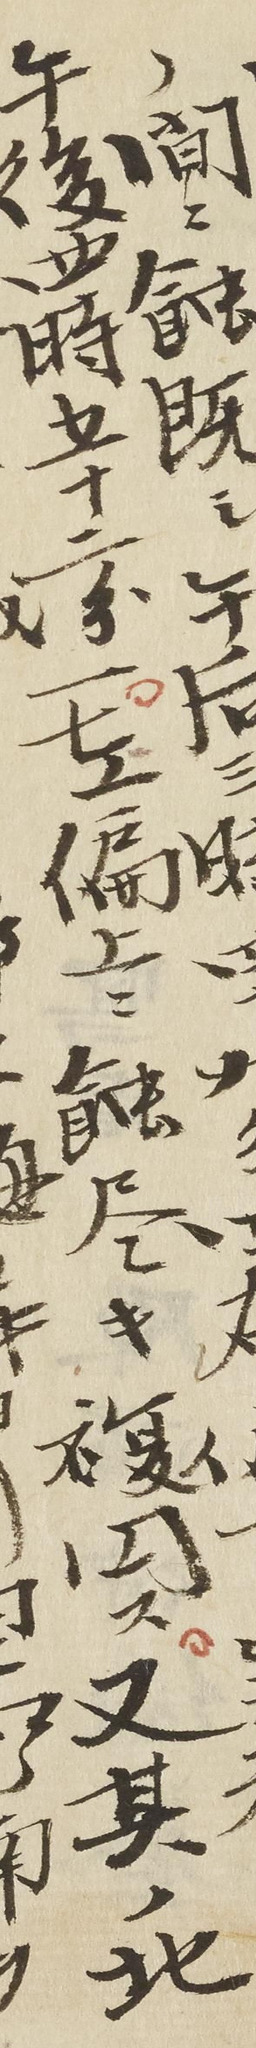午後四時五十二分一。左偏上ニ蝕尽キ複円ス。又其ノ北
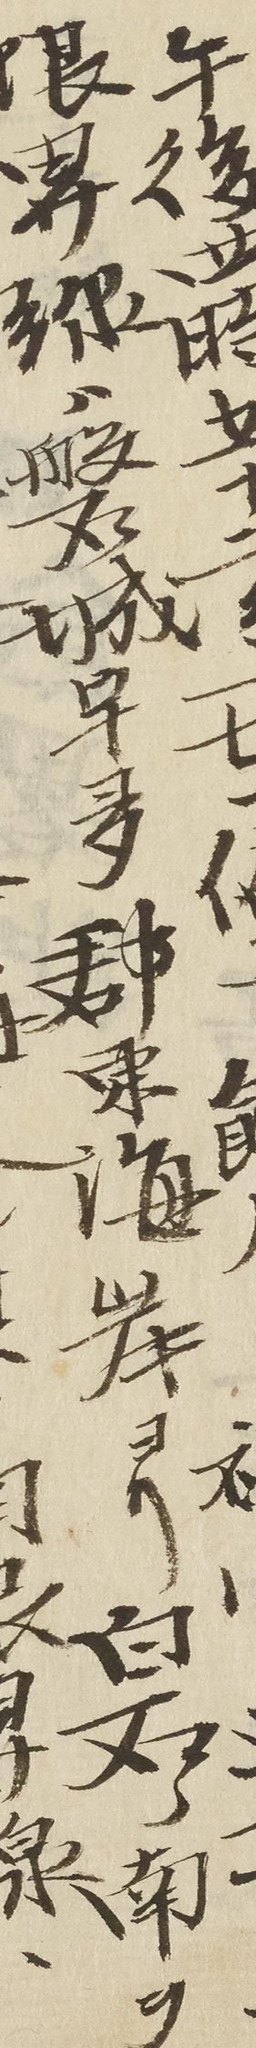限界線ハ磐城宇多郡東海岸ヨリ白石ノ南ヲ
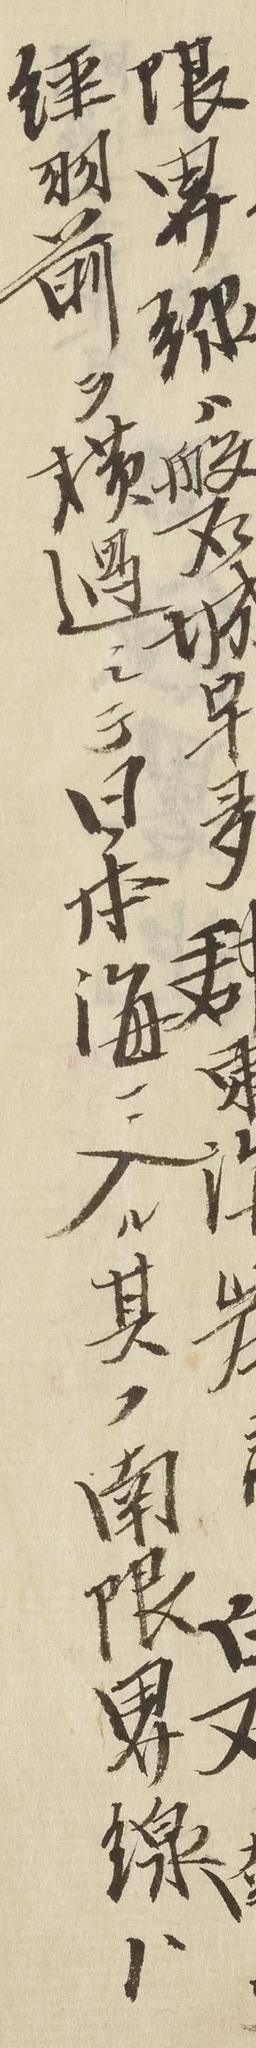経羽前ヲ横過シテ日本海ニ入ル其ノ南限界線ハ
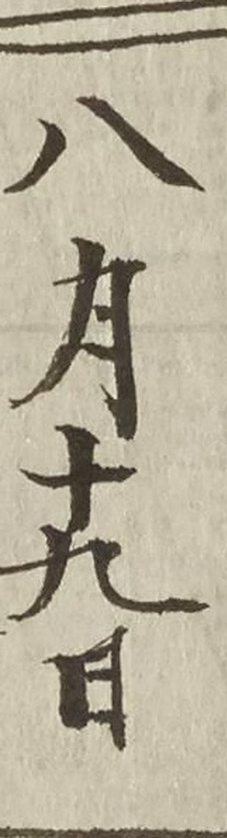八月十九日
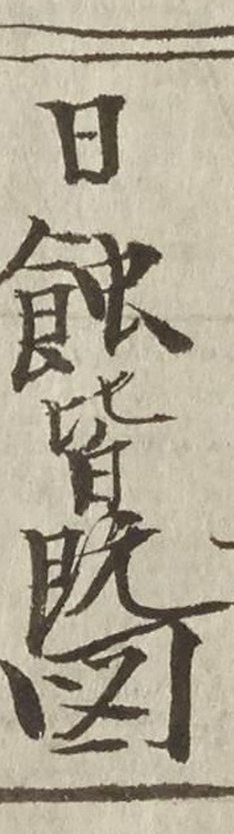日蝕皆既図

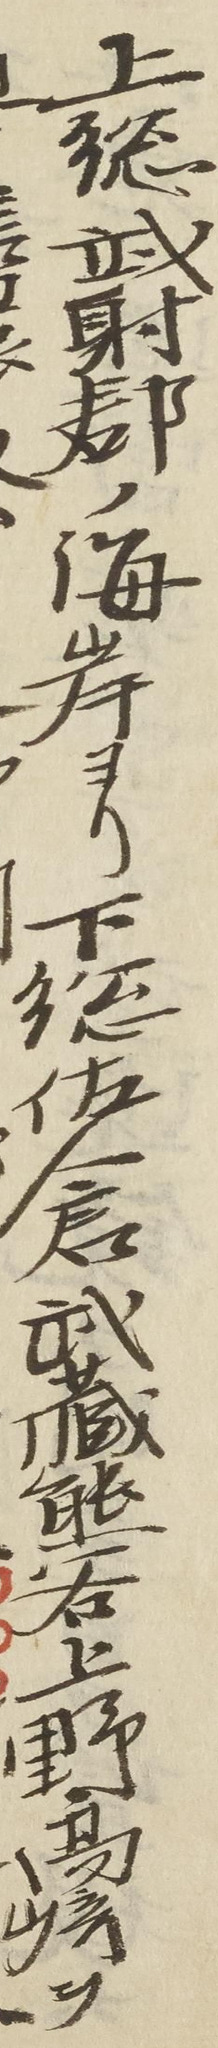上総武射郡ノ海岸ヨリ下総佐倉武蔵熊谷上野高崎ヲ
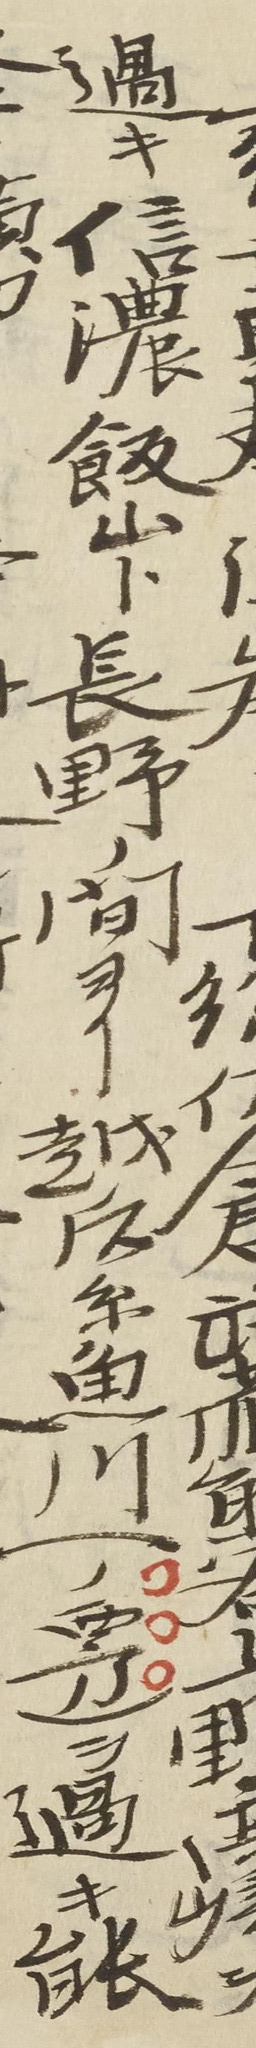過キ信濃飯山ト長野の間ヨリ越后糸魚川ヲ過キ能
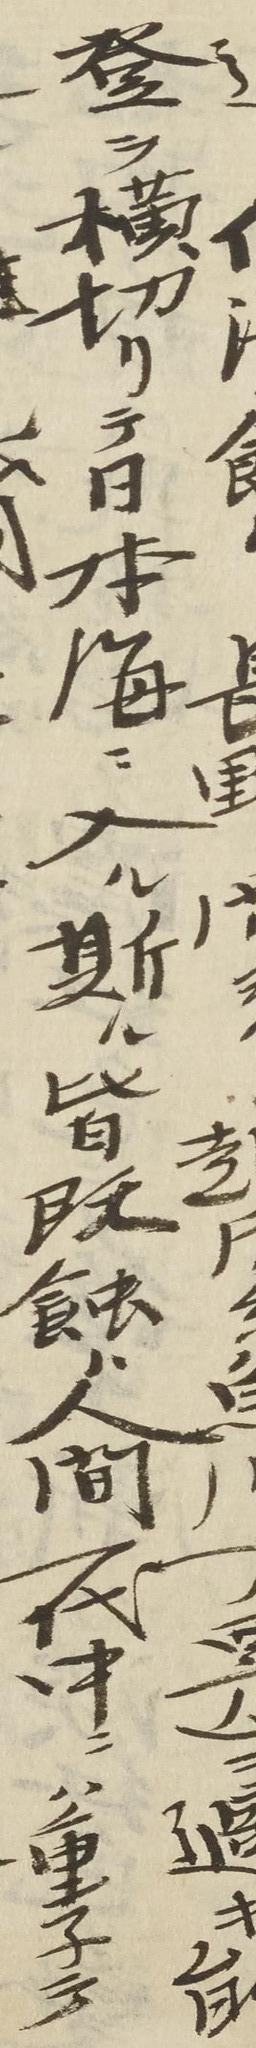登ヲ横切リテ日本海ニ入ル斯ル皆既蝕ハ人間一代中ニハ重子テ
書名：日蝕録　全
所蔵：東京大学地震研究所図書室 Earthquake Research Institute Library, The University of Tokyo, JAPAN
